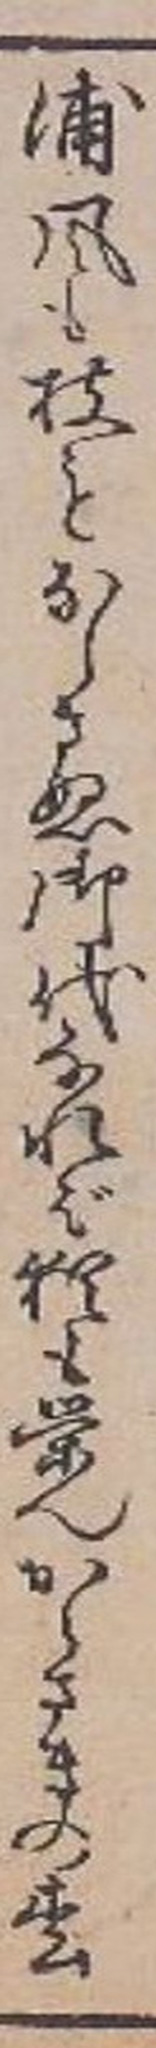浦風も枝もならさぬ御代なれば猶も栄んからさきの松
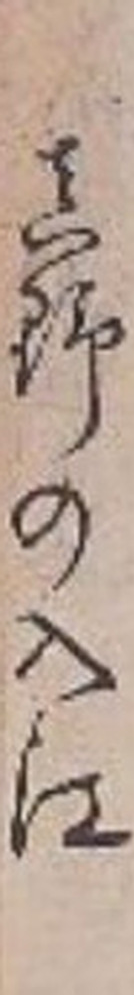真野の入江
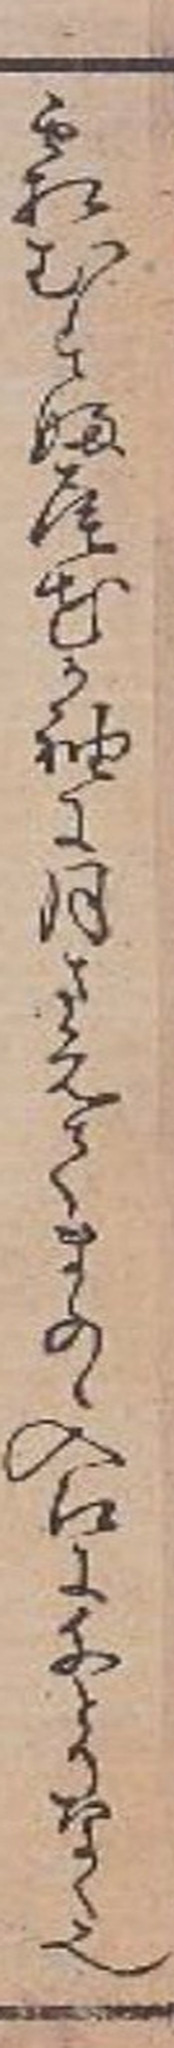霜むすふ尾花か袖に月さえてまのゝ入江にちとりなく也
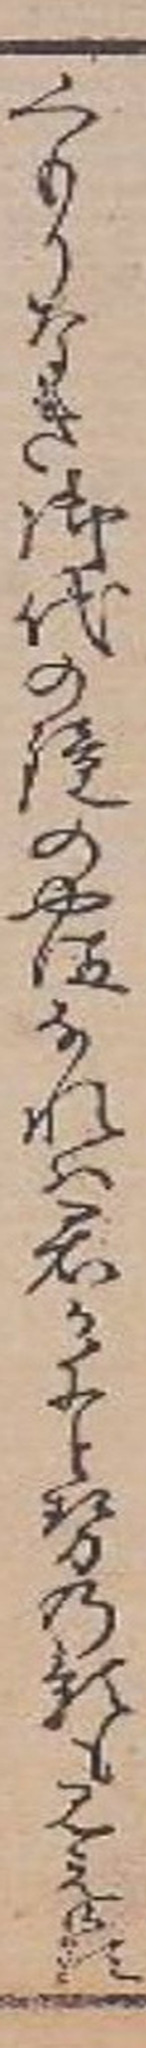くもりなき御代の鏡のやまなれは君か千とせの影も見えける
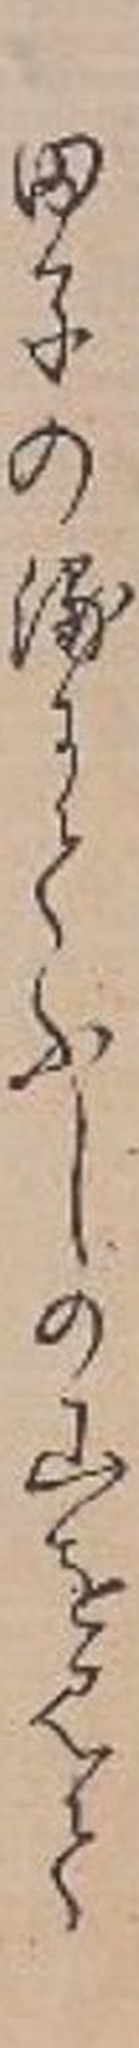田子の浦にてふしの山を見て
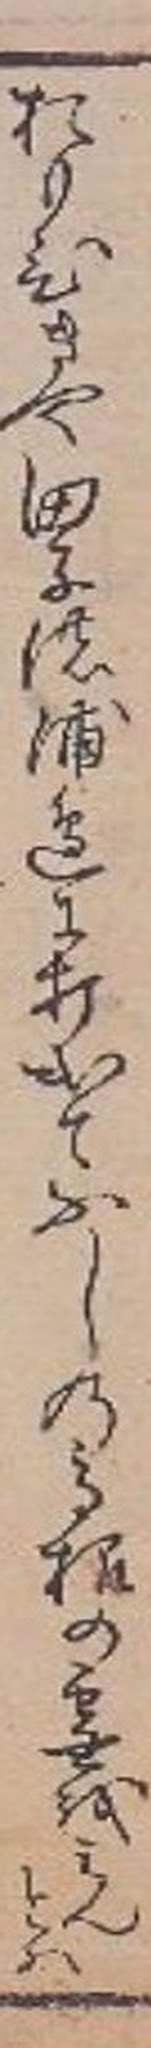おもひきや田子の浦辺に打出てふしの高根の雪をみんとは
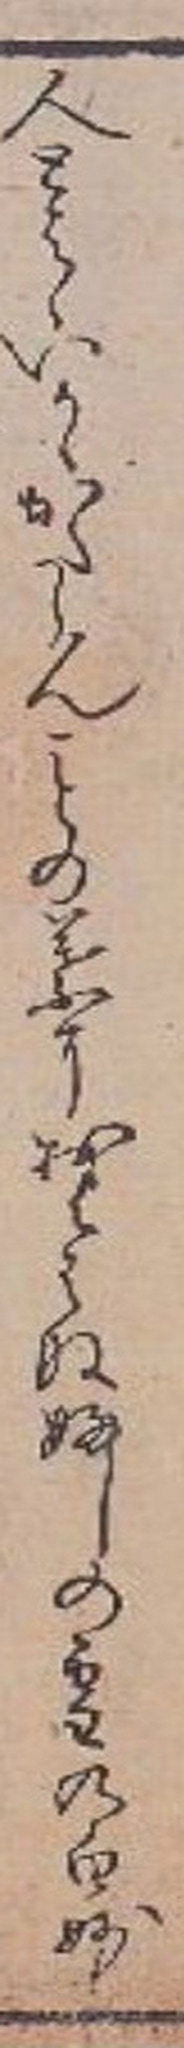人とはゝいかゝかたらんことの葉にそはぬふしの雪の白妙
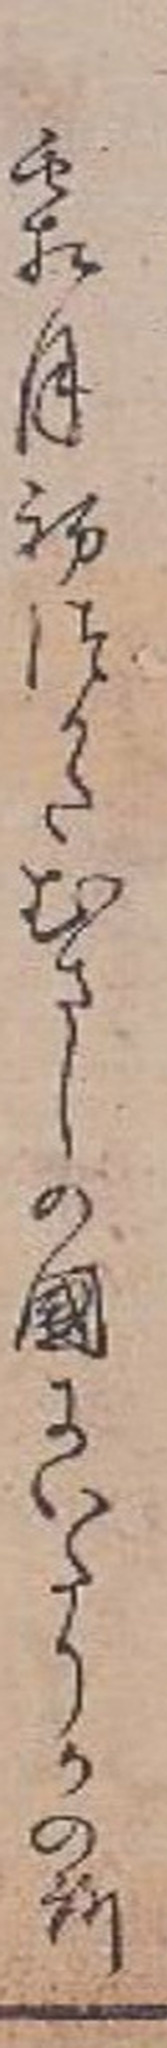霜月初つかたむさしの国にいたりかの所
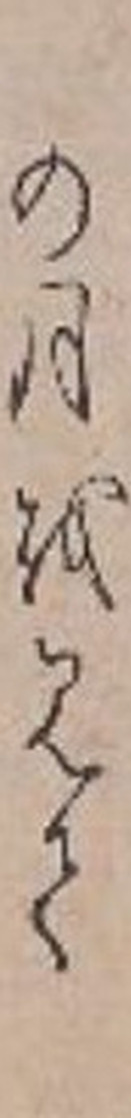の月を見て
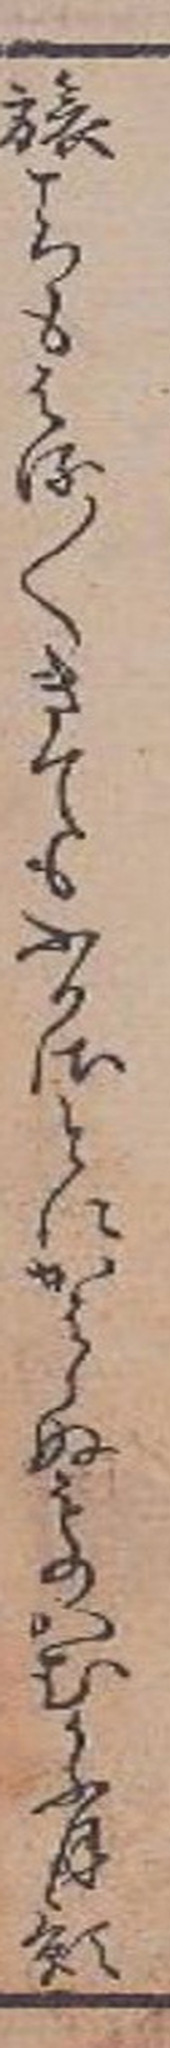旅ころもはる〳〵きてもふるさとにかはらぬものはむかふ月影

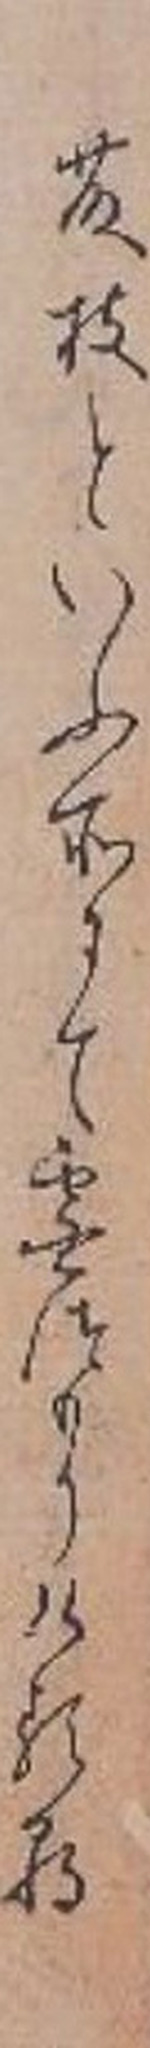藤枝といふ所にて雪つもりける朝
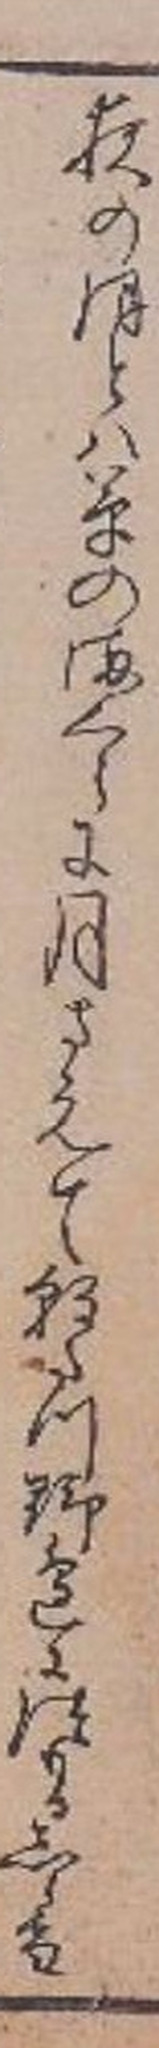夜のほとは草のまくらに月さえて朝たつ野辺につもるしら雪
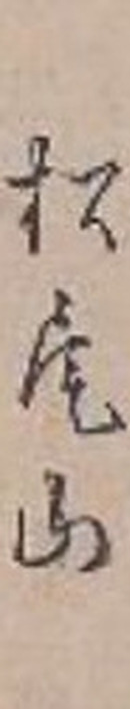松尾山
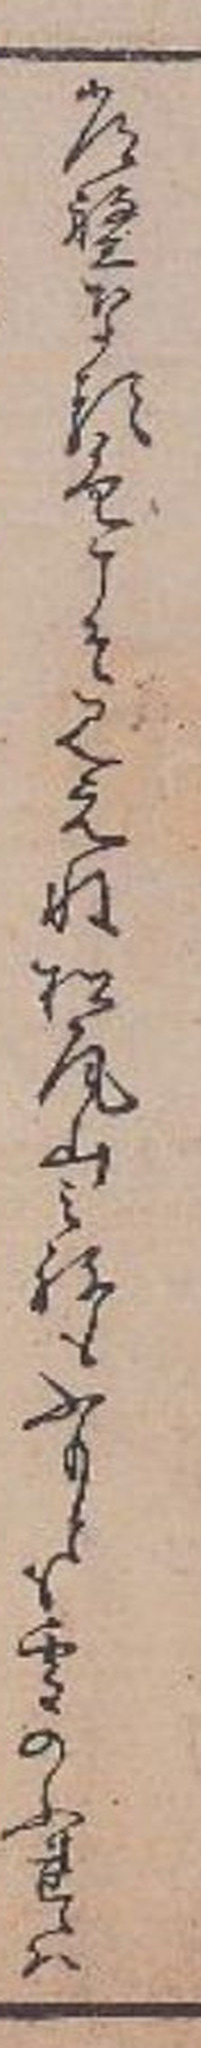常盤なる色こそ見えね松尾山みねもふもとも雪のふれゝは
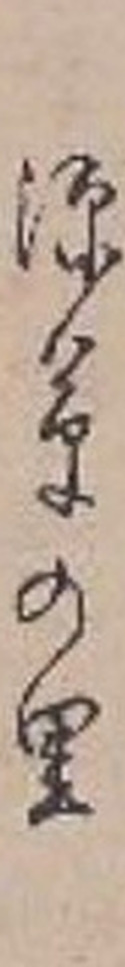深草の里
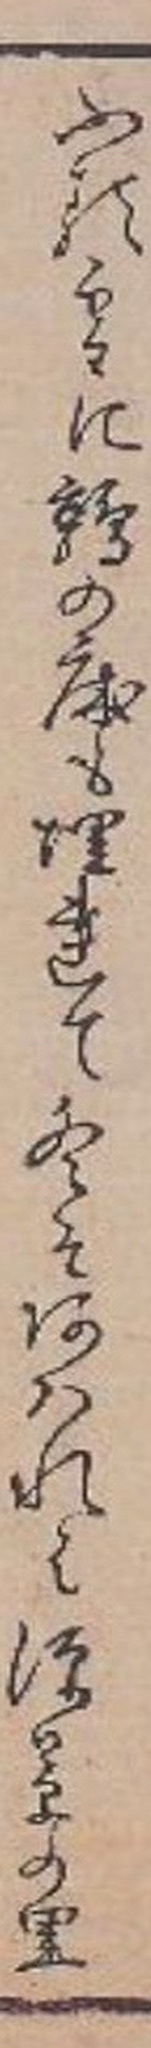ふる雪に鶉の床も埋れて冬そあはれは深草の里
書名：琉球談
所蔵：University of the Ryukyus Library
